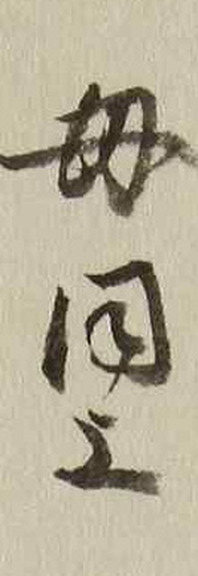母同上
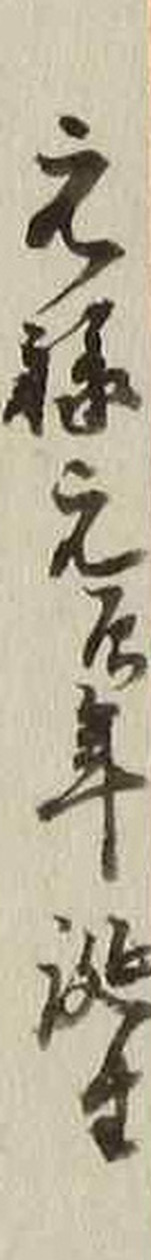元禄元辰年誕生
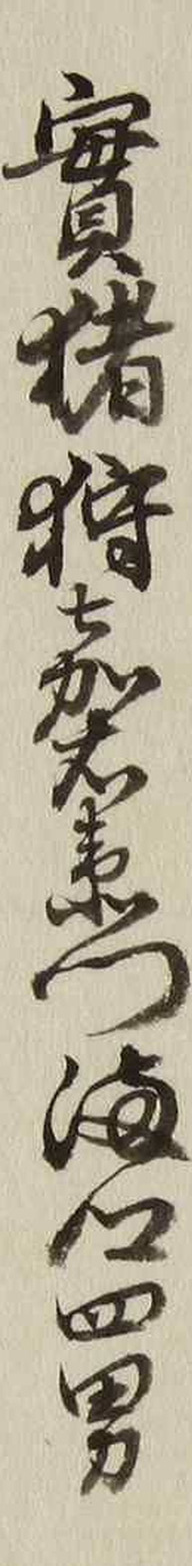実猪狩嘉右衛門満郷四男
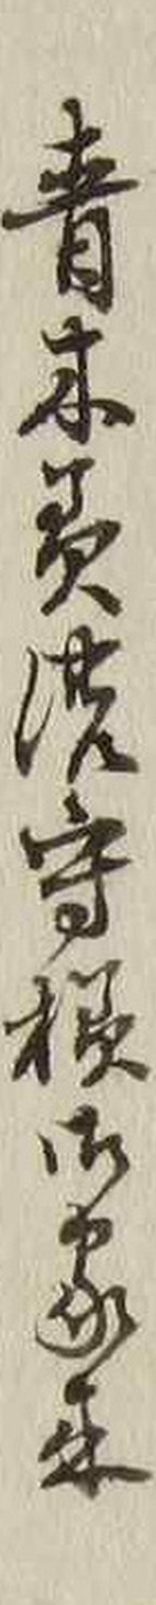青木美濃守様御家来
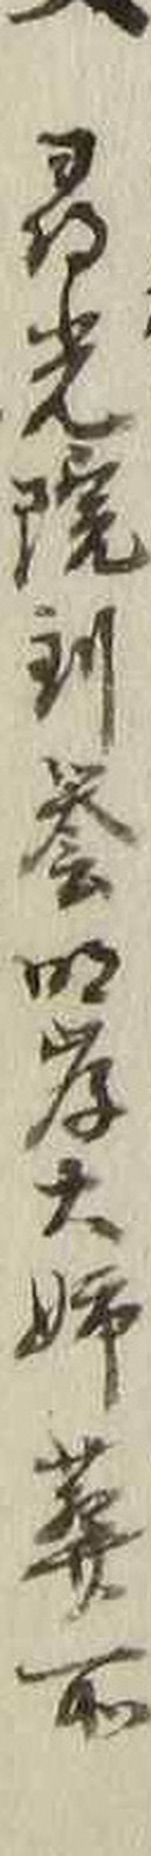尋光院到誉明岸大姉葬所
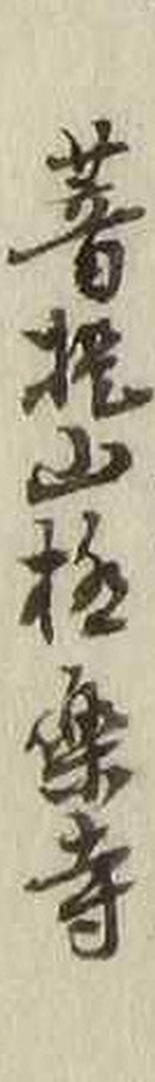菩提山極楽寺
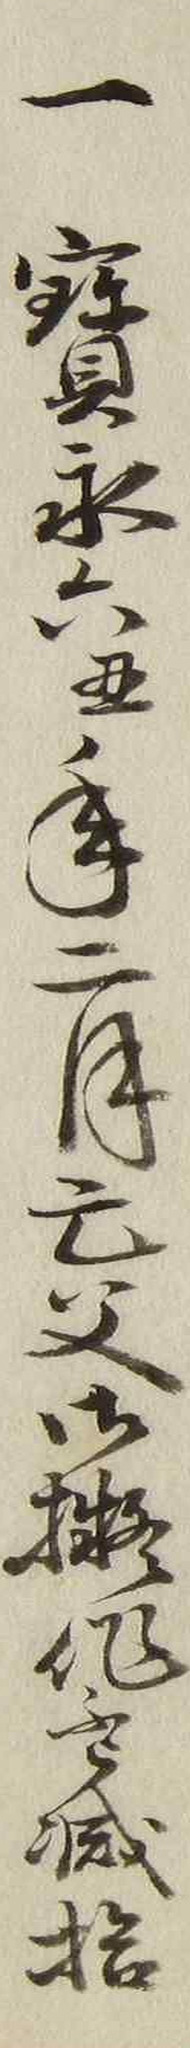一宝永六丑年二月亡父御擬作不被減拾
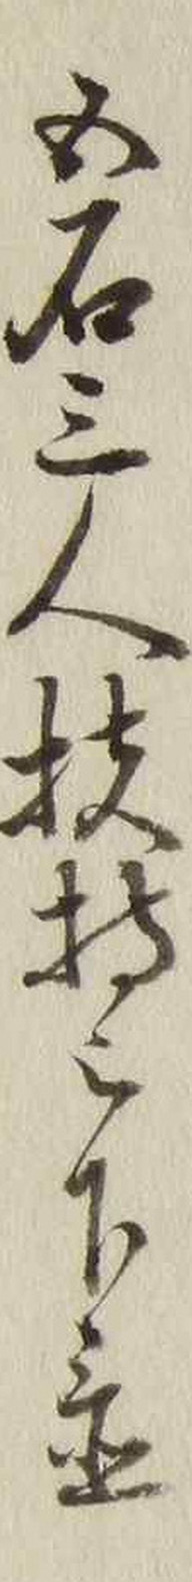五石三人扶持被下置
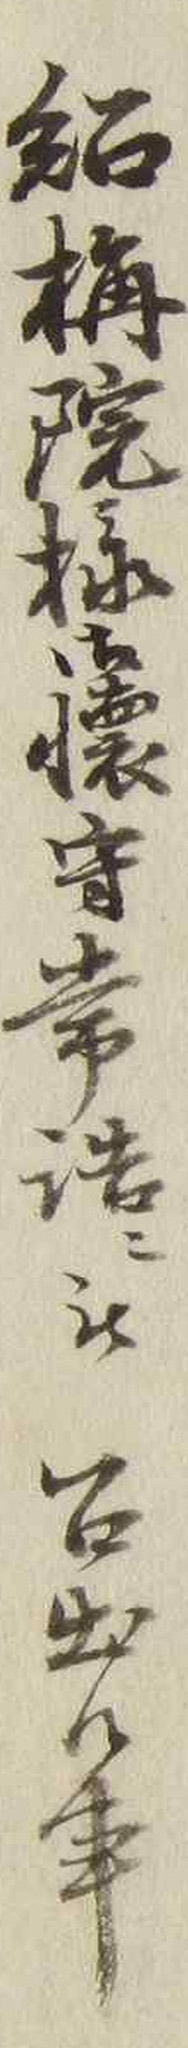紹栴院様御懐守常詰ニ被召出候事

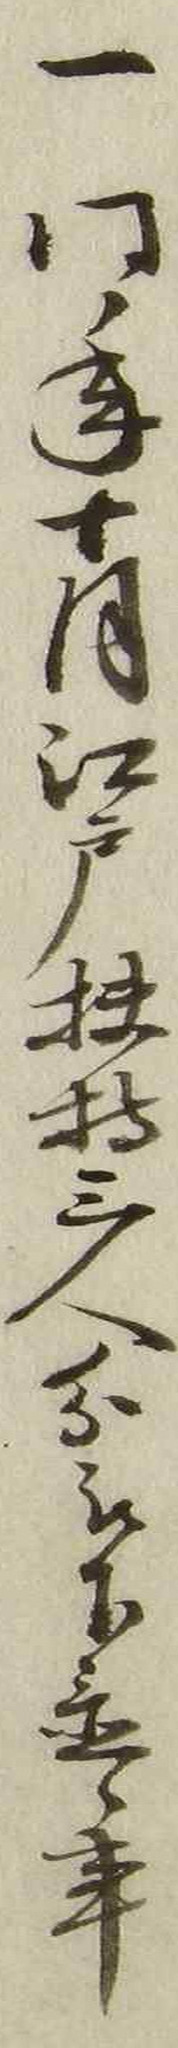一同年十月江戸扶持三人分被下置候事
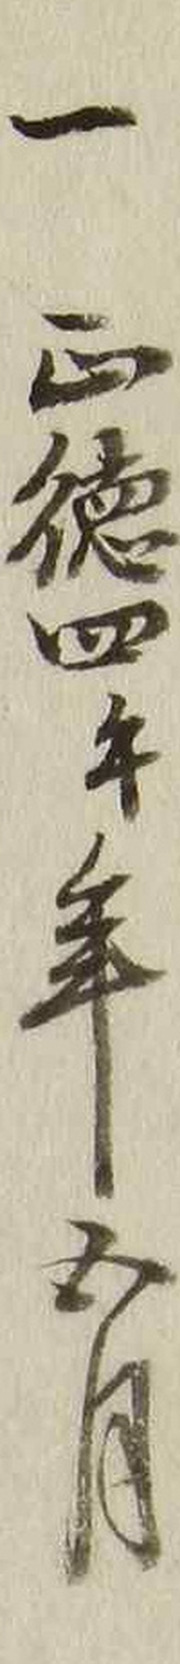一正徳四午年五月
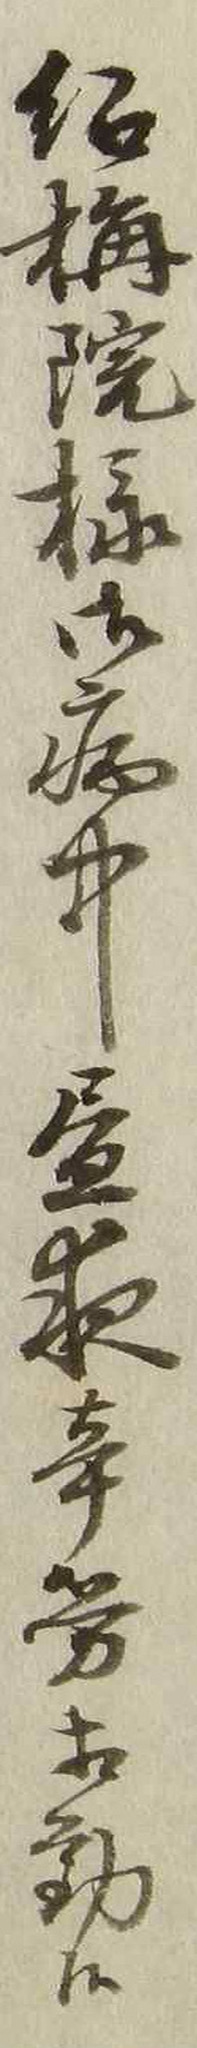紹栴院様御病中昼夜辛労相勤候
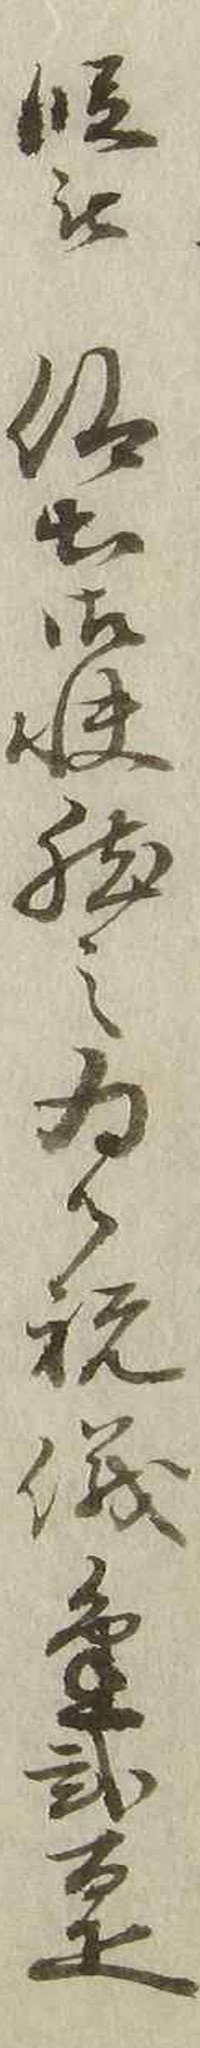段被仰出御快然之為御祝儀金弐百疋
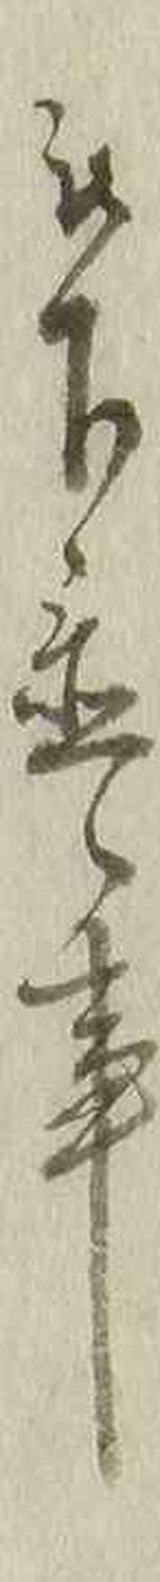被下置候事
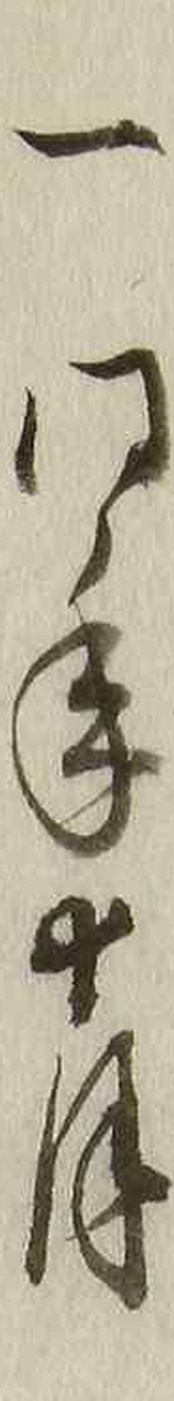一同年十月
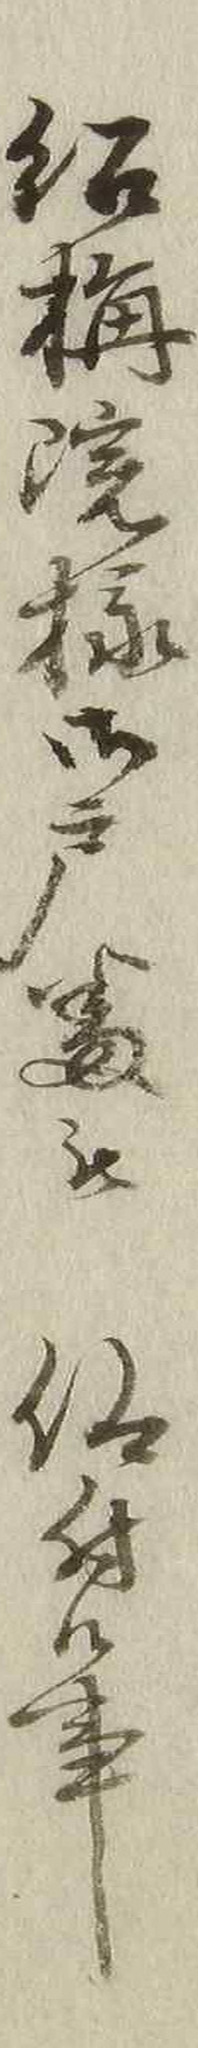紹栴院様御戸番被仰付候事
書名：諸士系譜　巻之27　い之部27
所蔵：会津若松市立会津図書館
